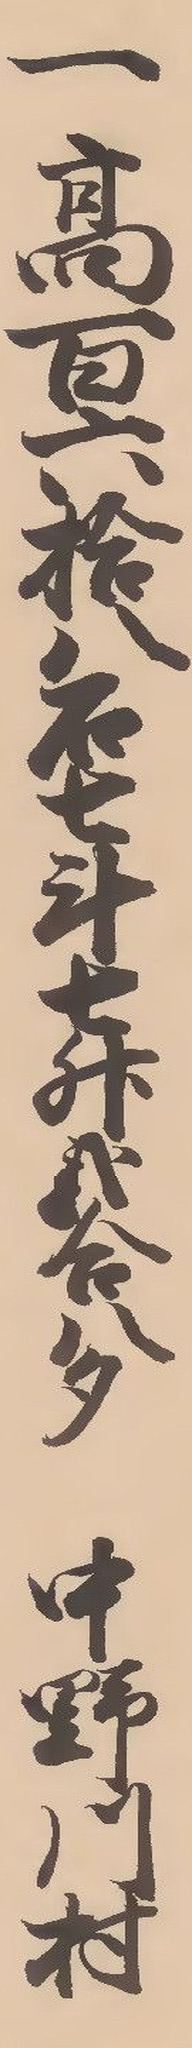一高百六拾八石七斗七升弐合八勺中野川村
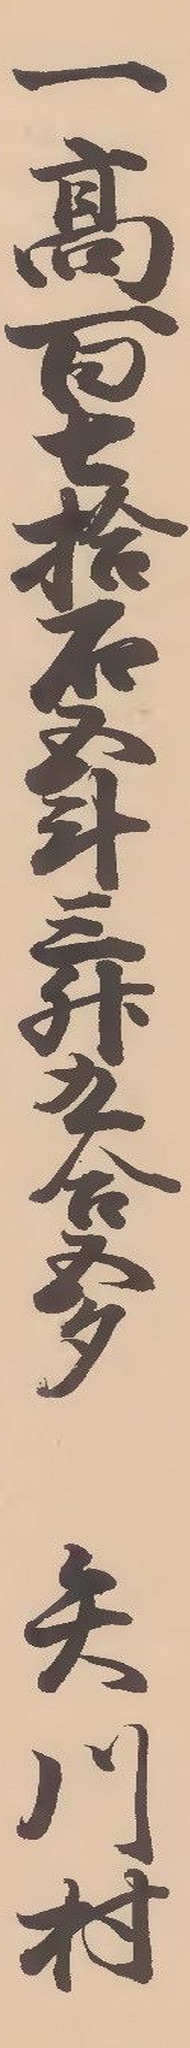一高百七拾石五斗三升九合五勺矢川村
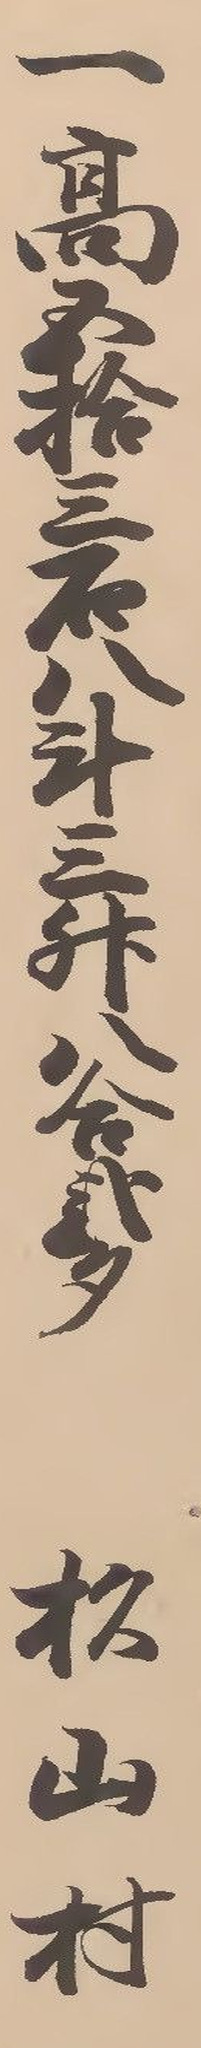一高五拾三石八斗三升八合弐勺杉山村
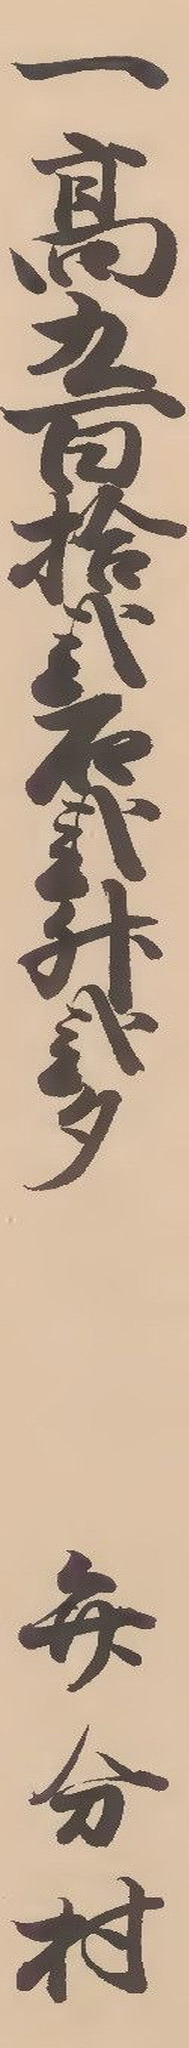一高九百拾弐石弐升弐勺弁分村
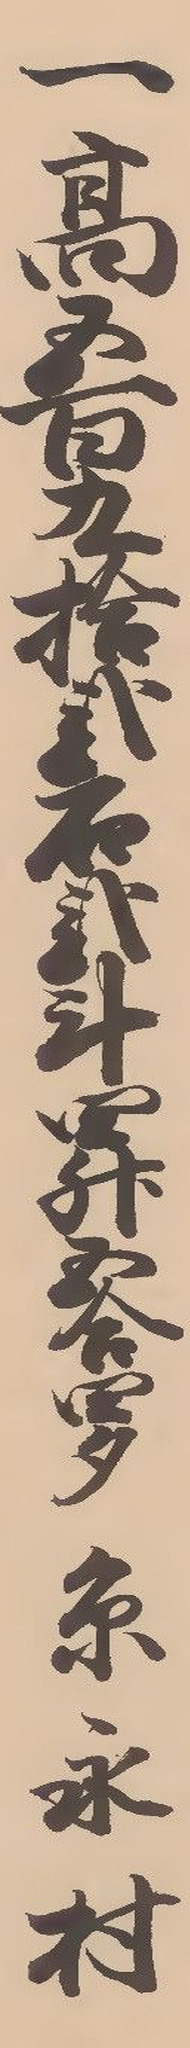一高五百九拾弐石弐斗四升五合四勺糸永村
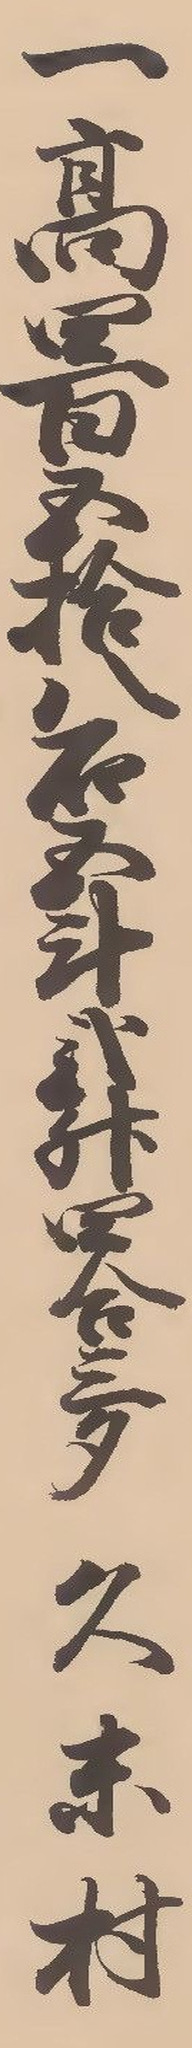一高四百五拾八石五斗弐升四合三勺久末村

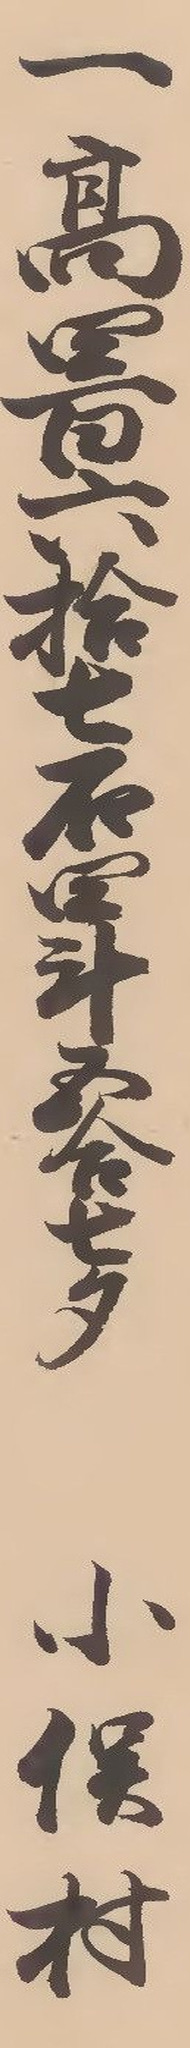一高四百六拾七石四斗五合七勺小俣村
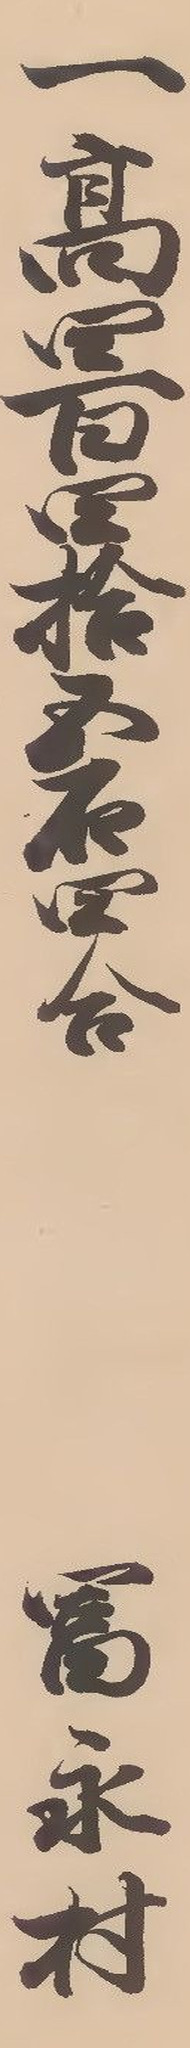一高四百四拾五石四合富永村
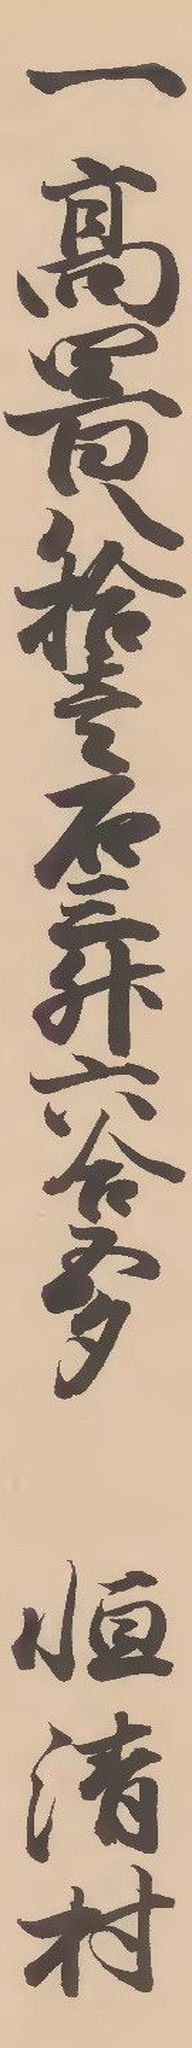一高四百八拾壱石三升六合五勺恒清村
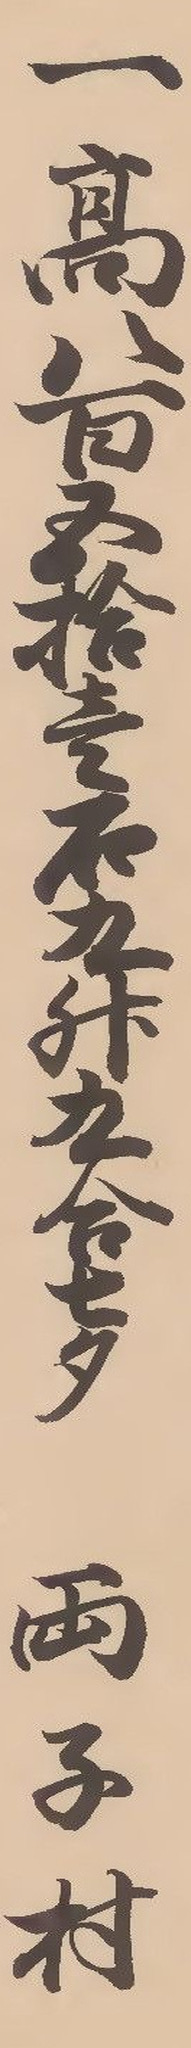一高八百五拾壱石九升九合七勺両子村
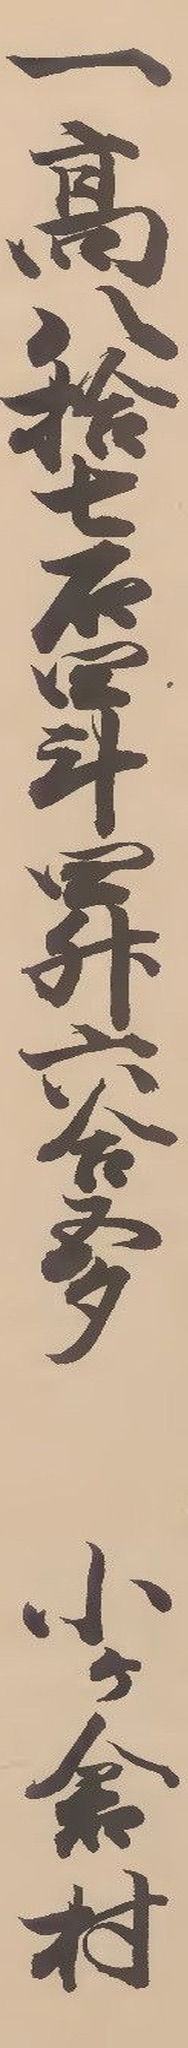一高八拾七石四斗四升六合五勺小ヶ倉村
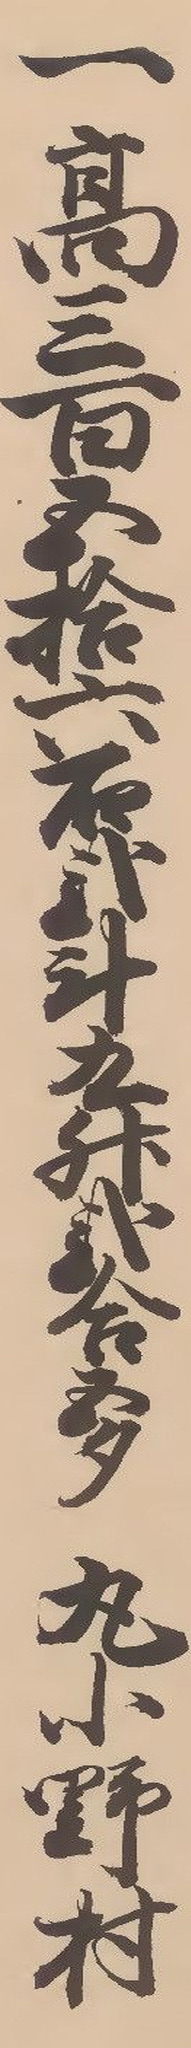一高三百五拾六石弐斗九升弐合五勺丸小野村
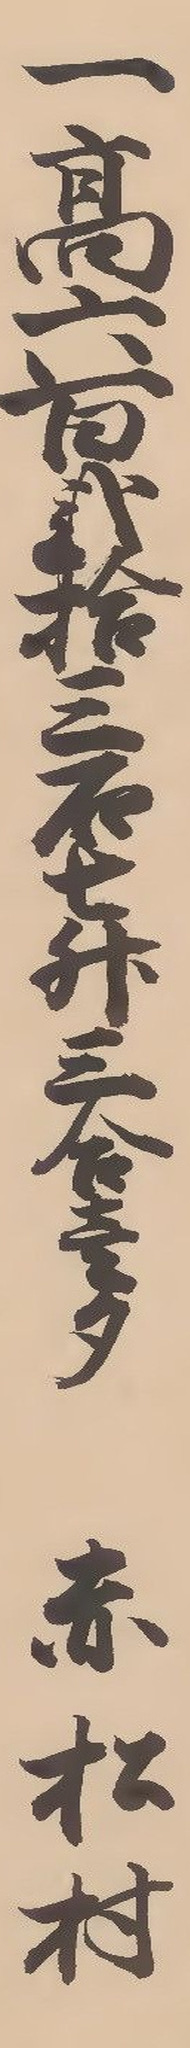一高六百弐拾三石七升三合壱勺赤松村
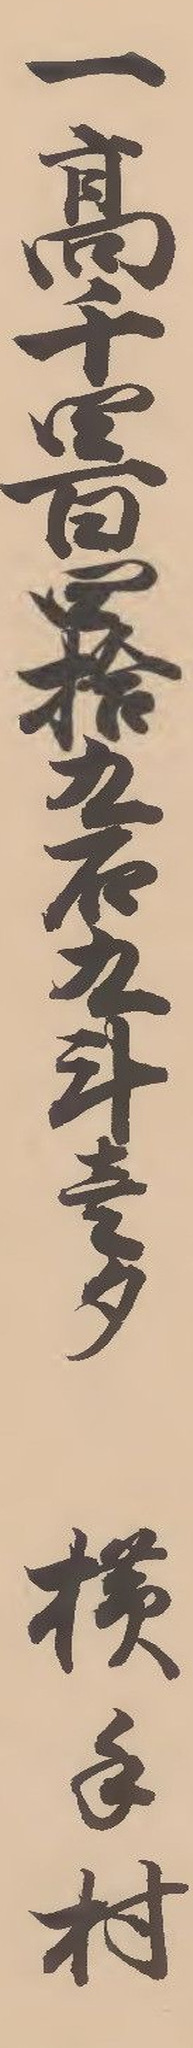一高千四百四拾九石九斗壱勺横手村

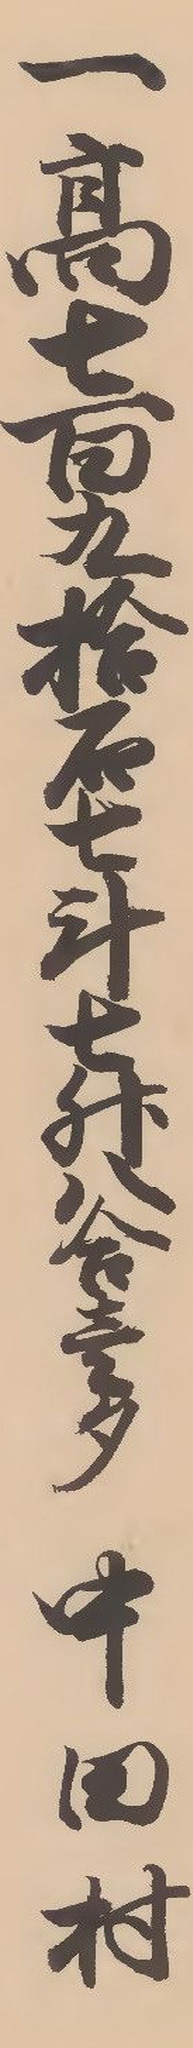一高七百九拾石七斗七升八合壱勺中田村
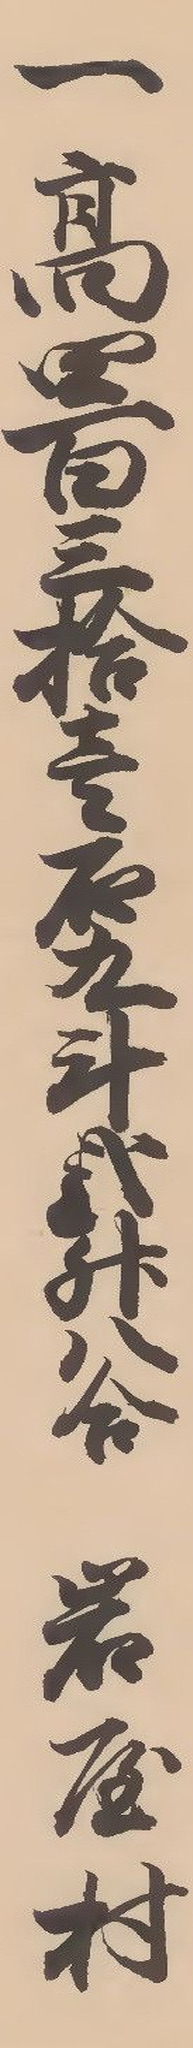一高四百三拾壱石九斗弐升八合岩屋村
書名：豊後国郷帳
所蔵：国立公文書館 National Archives of Japan
